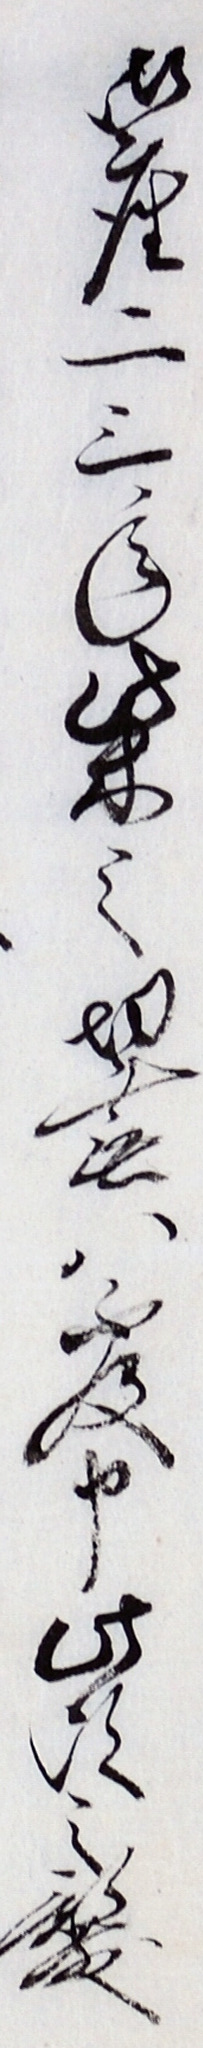御座二三年柴之切蕪ハ不及申此頃之新敷
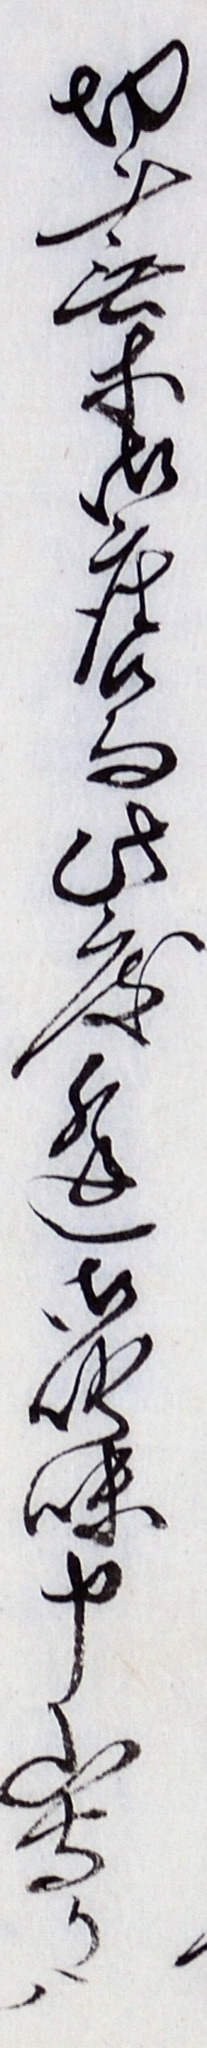切蕪等御座候而此度逢御吟味申山守りハ
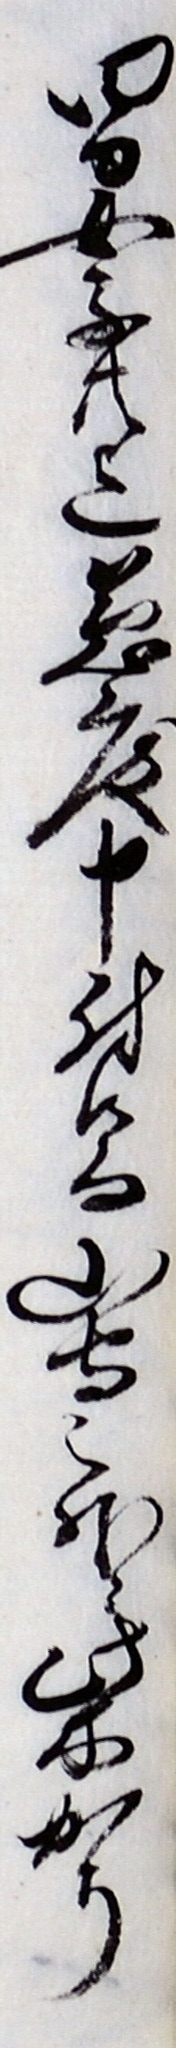男女子共迄急度申付候而山守之外ニ柴かり
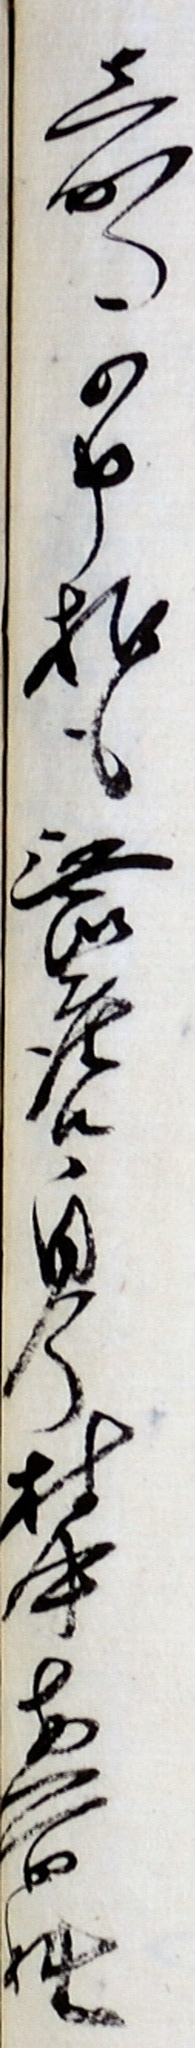しかり可申様も無御座候自今村中惣百姓
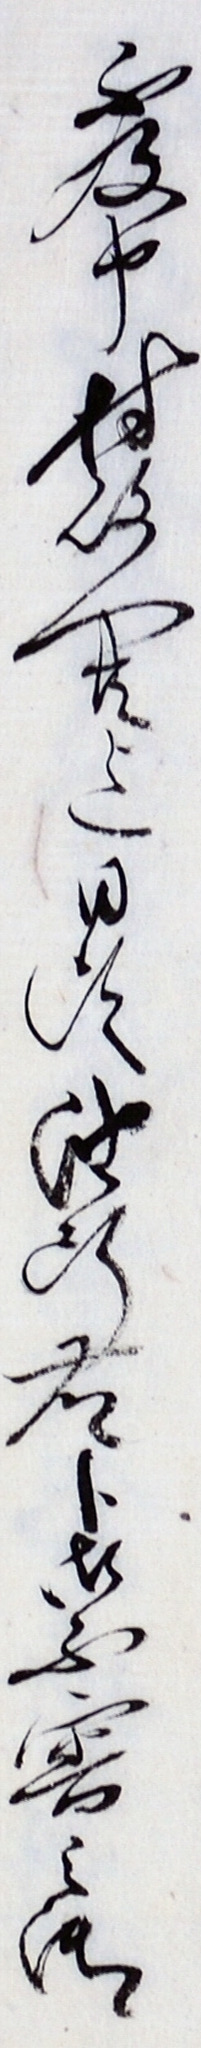不及申村役人共迄日頃油断故ト御不審之御
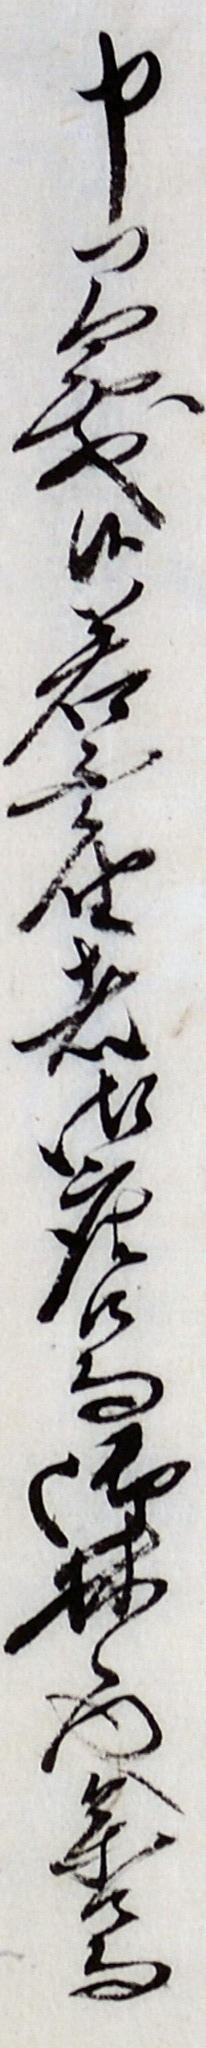申間敷候若不届者御座候而御林之内へ参候而
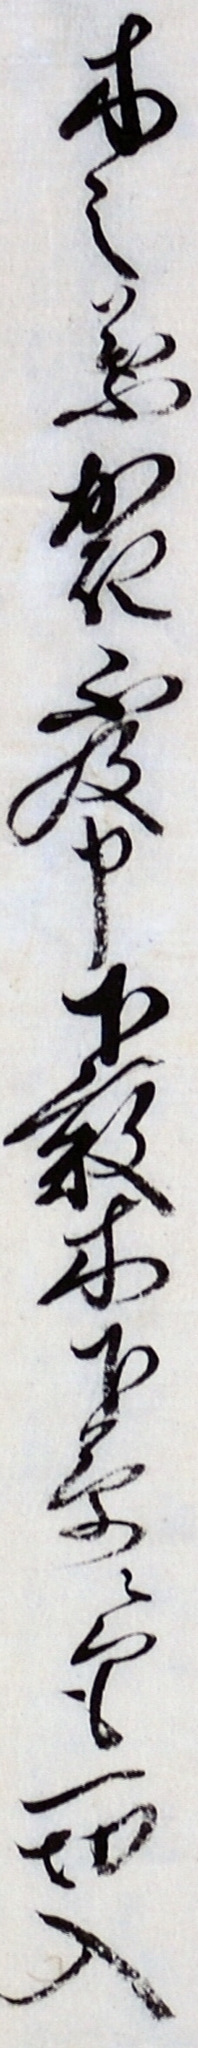木之葉かき不及申下薮木下草ニ而も一切入
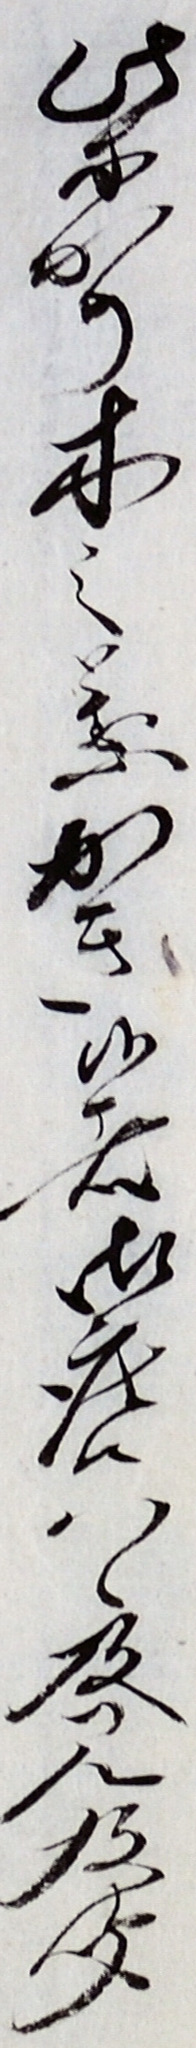柴かり木之葉かき候者御座候ハヽ及見及聞
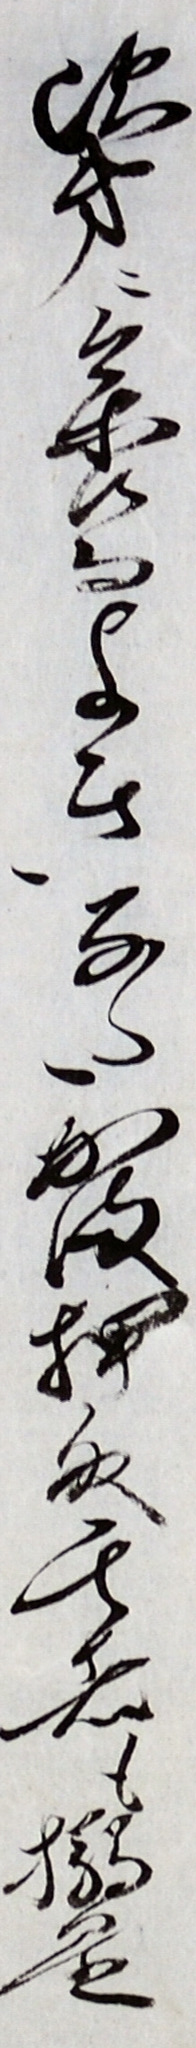次第ニ参候而よきなたかま押取其者も搦置
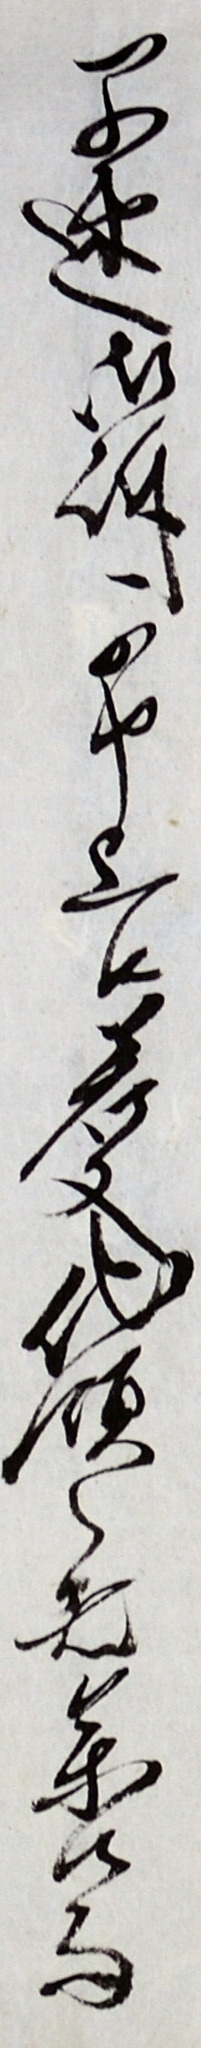早速御訴可申上候若又他領之者参候而
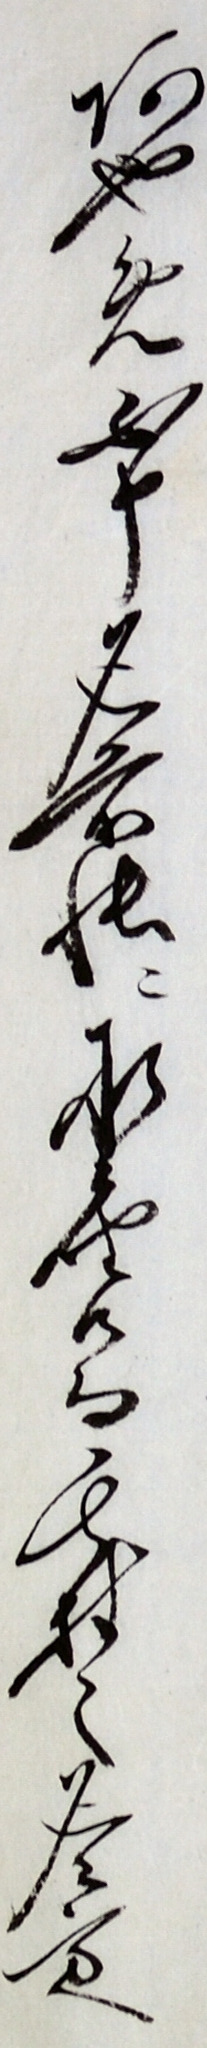あやめ不申名前帳ニ承届候而其村之名主方へ
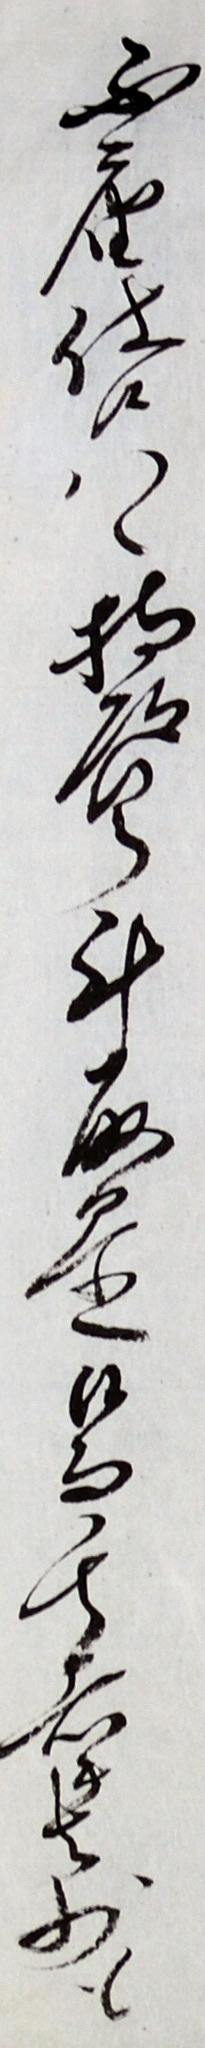不届仕候ハヽ持道具計取置候而其者ヲは少も

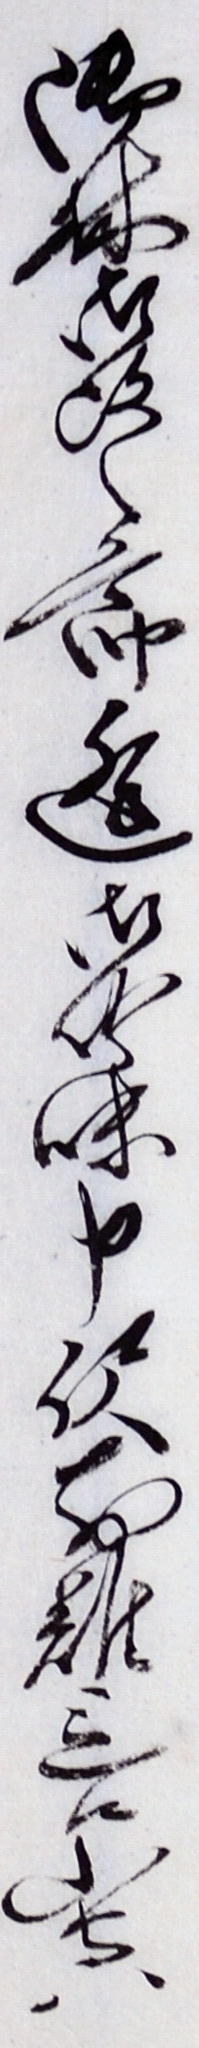御林御改之節逢御吟味申訳於難迄候山守ハ
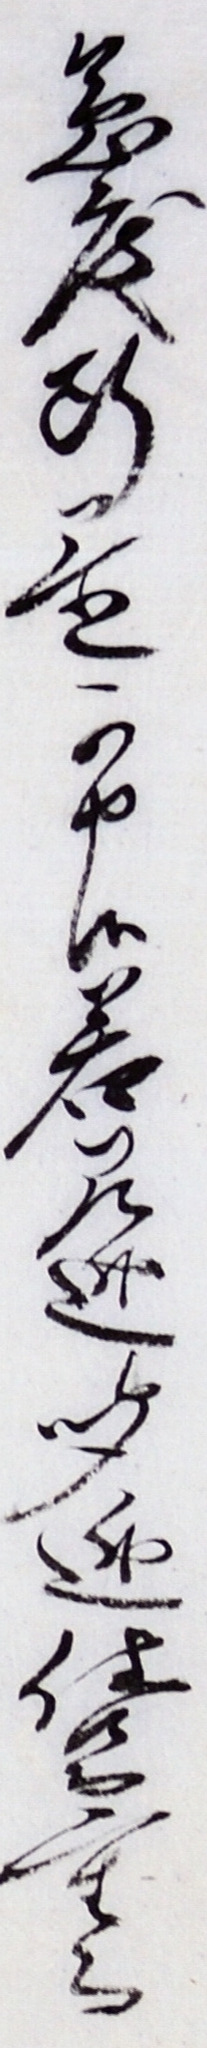急度断置可申候若見逃聞逃仕候而重而
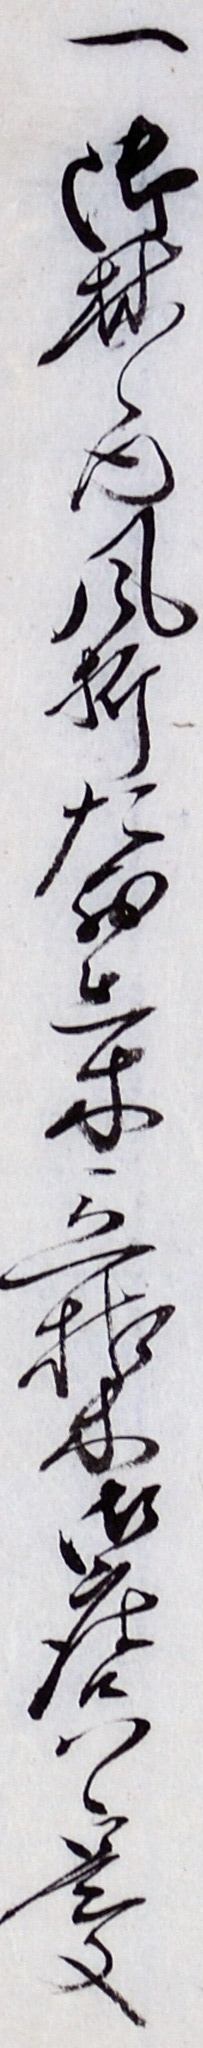一御林之内風折たおれ木立枯木御座候ハヽ是又
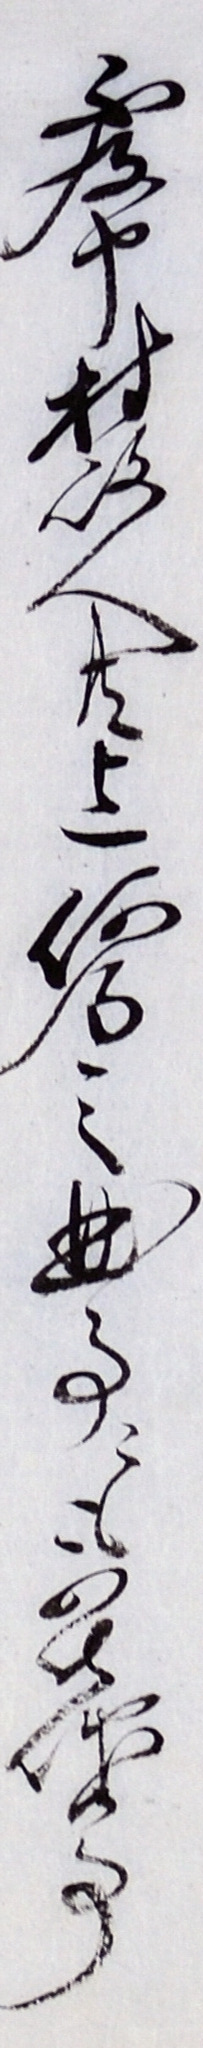不及申村役人共迄何分之曲事ニも可被仰候事
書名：御林御竹藪証文控
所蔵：伊那市立高遠町図書館・合同会社AMANE
